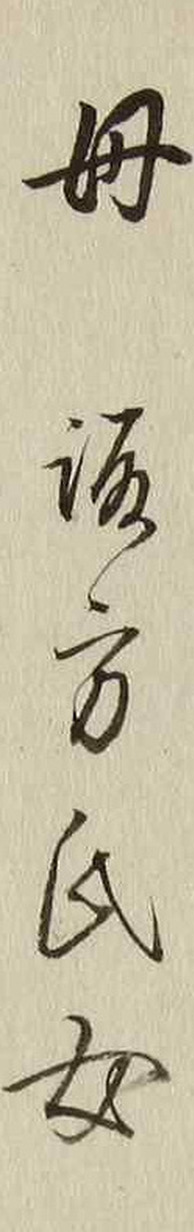母諏方氏女
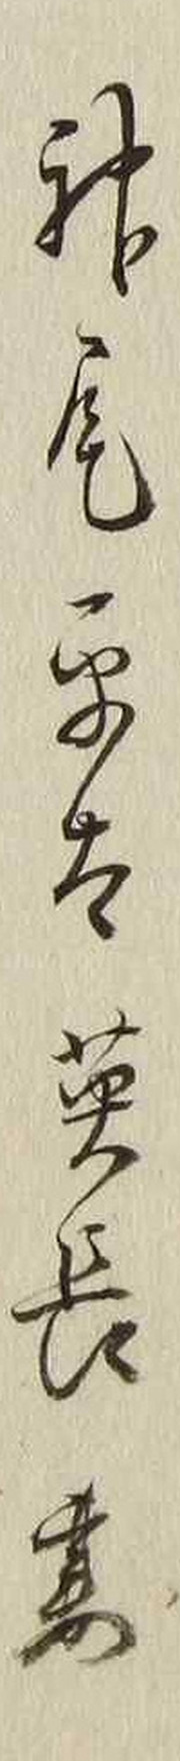神尾平太英長妻
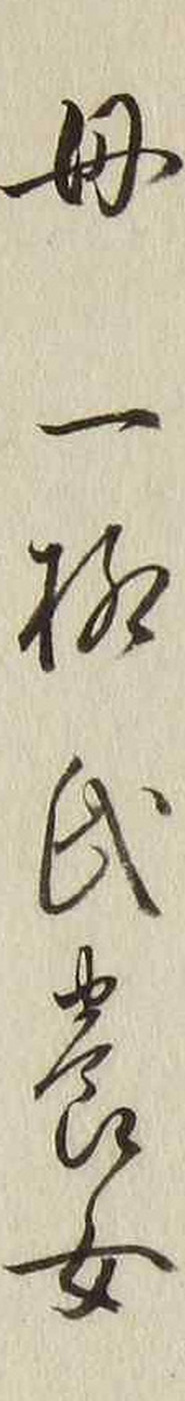母一柳氏養女
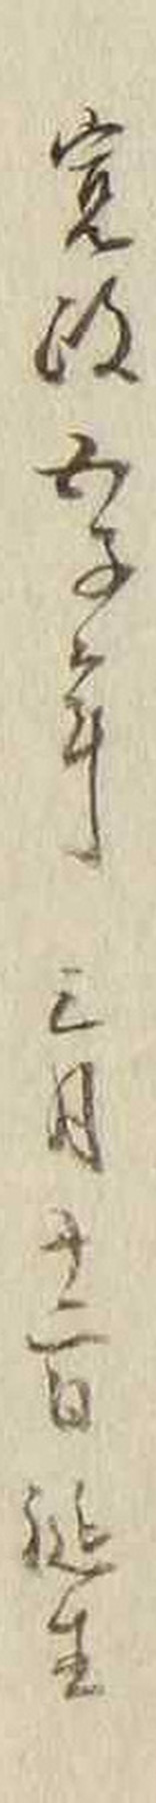寛政五子年三月十二日誕生

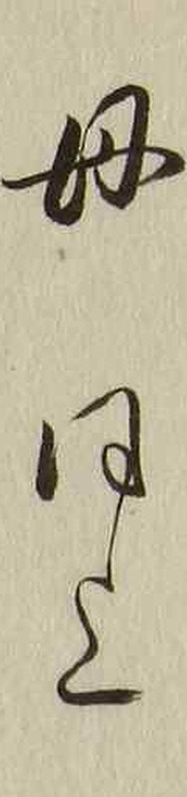母同上
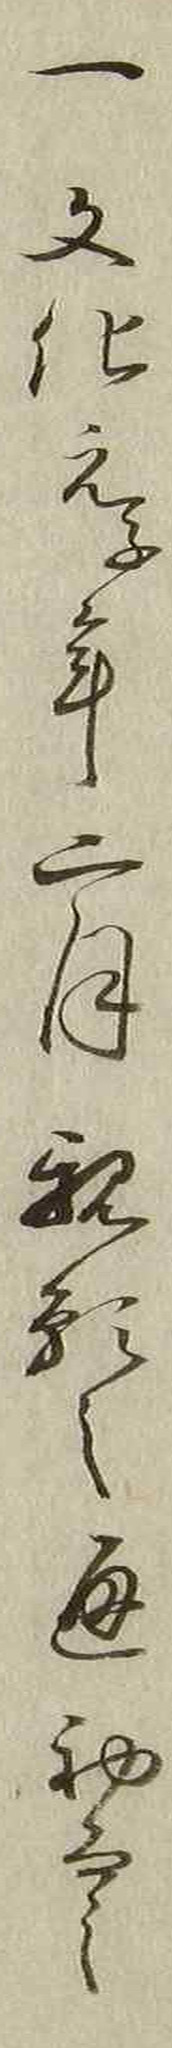一文化元子年二月親願之通初而之
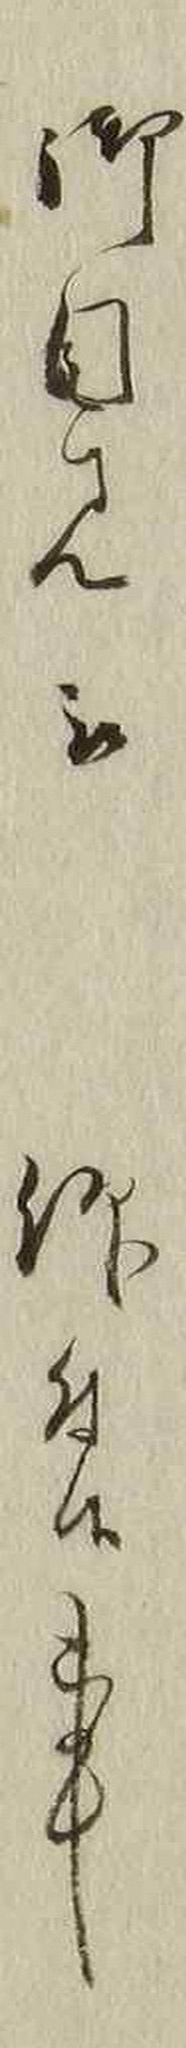御目見被仰付候事
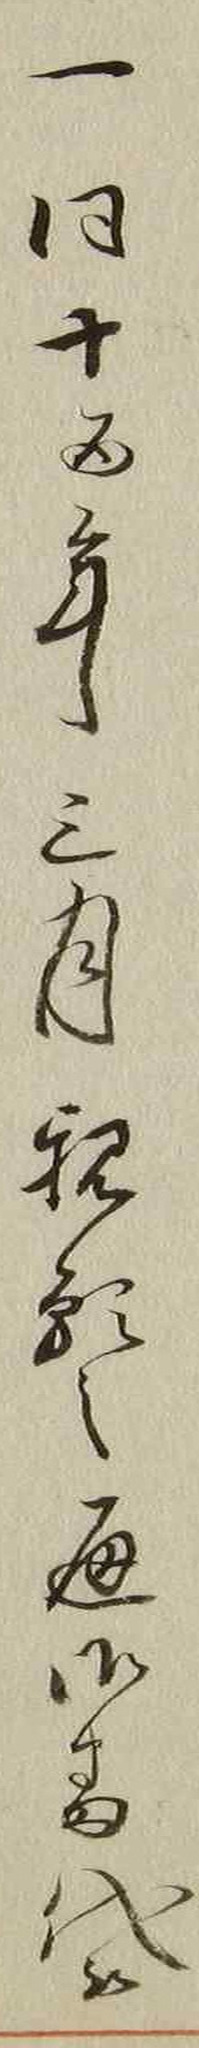一同十酉年三月親願之通御番代被
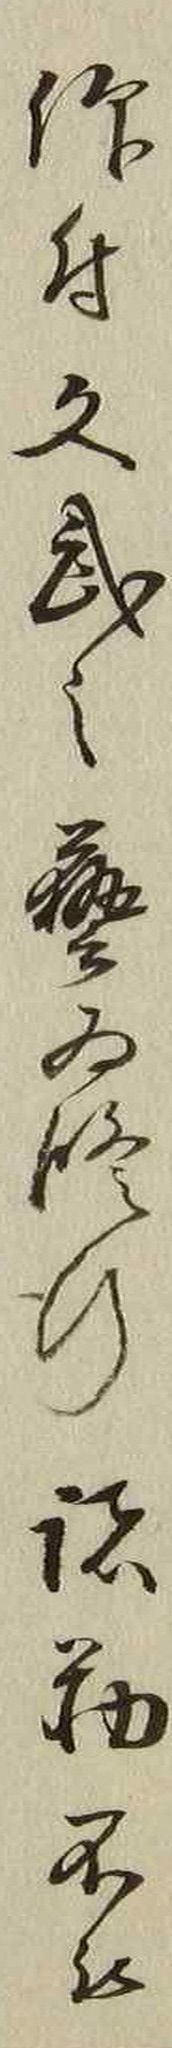仰付久武之芸為修行諸勤不被
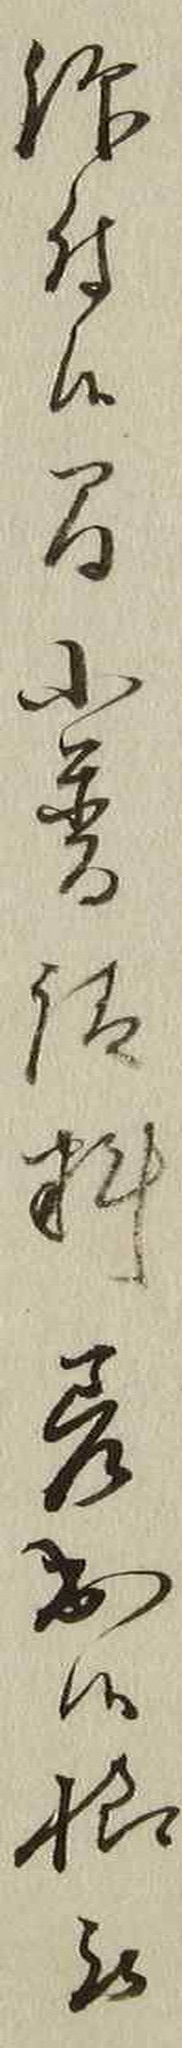仰付候間小普請料差出候様被
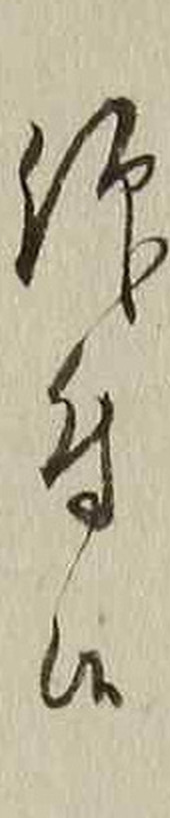仰付候
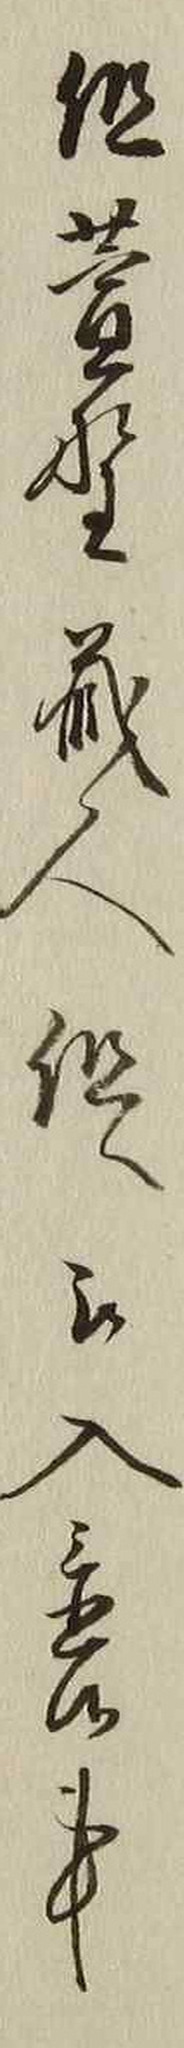但萱野蔵人組へ被入置候事
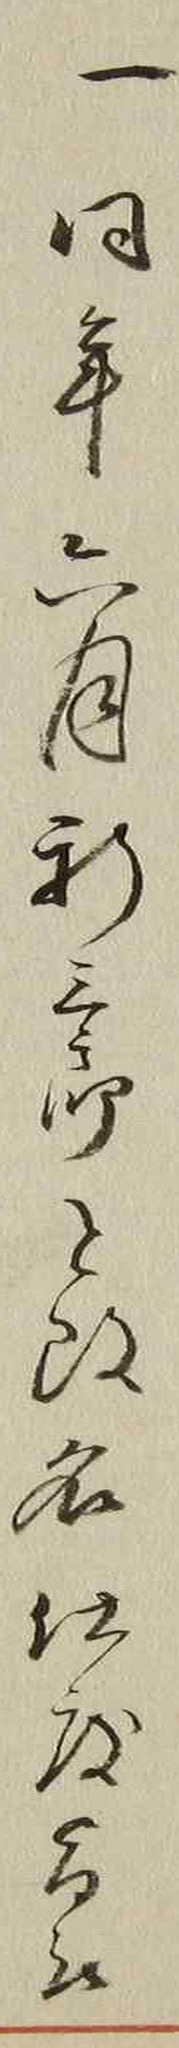一同年六月新三郎と改名仕度旨被
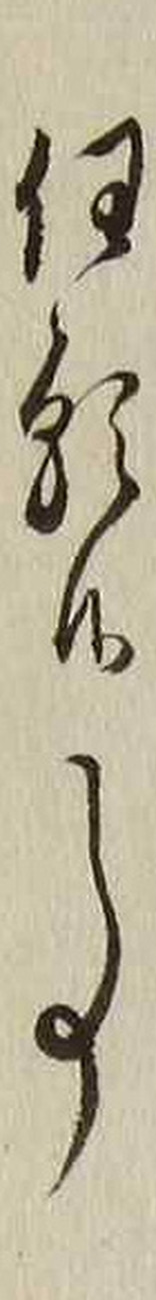任願候事
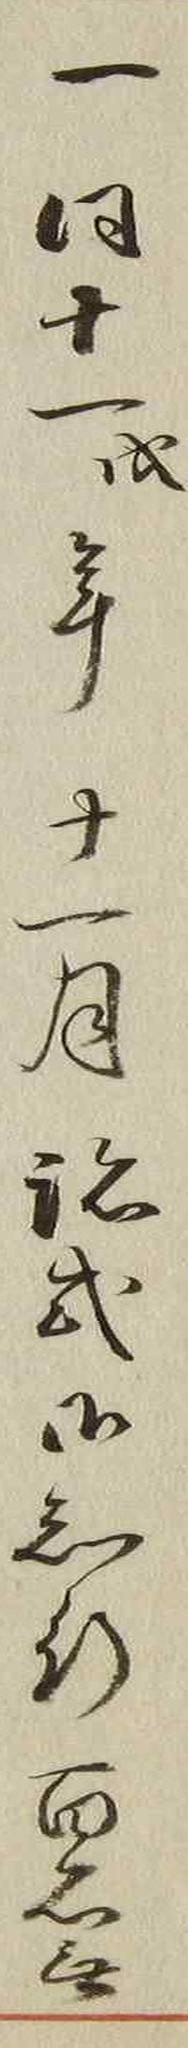一同十一戌年十一月跡式御知行百石無
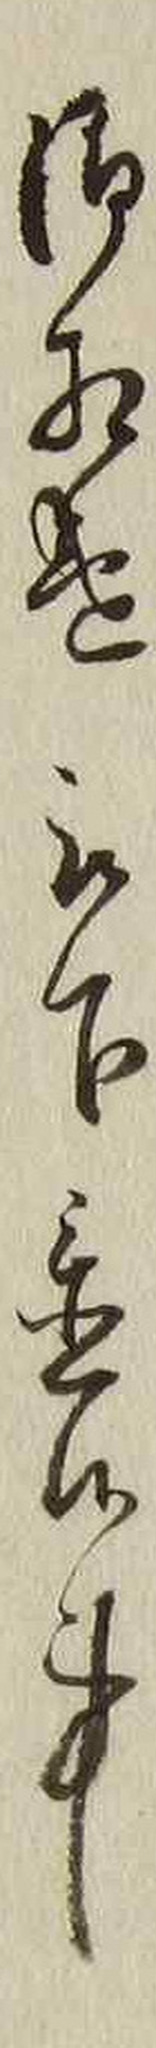御相違被下置候事
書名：諸士系譜　巻之28　い之部28
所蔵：会津若松市立会津図書館
